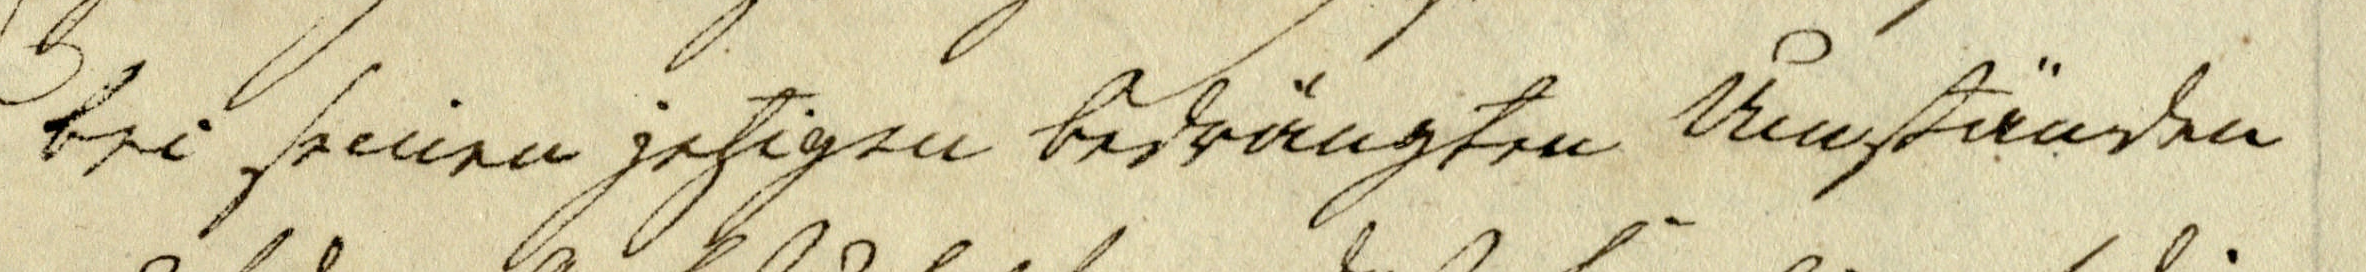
bei seinen jetzigen bedrängten Umständen
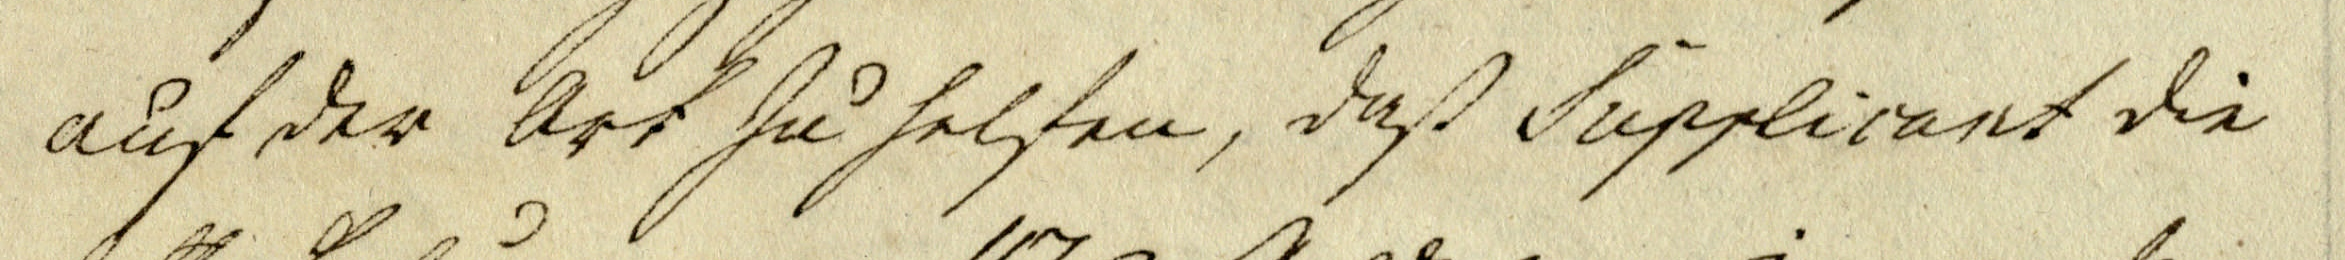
auf der Art zu helfen, daß Supplicant die
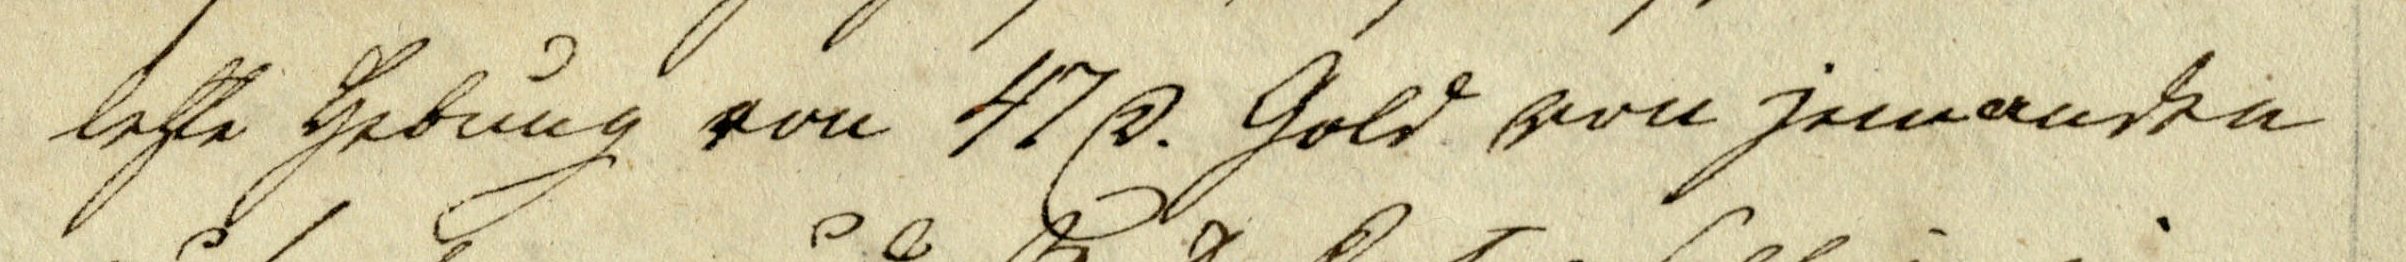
letzte Hebung von 47 l. Gold von jemanden
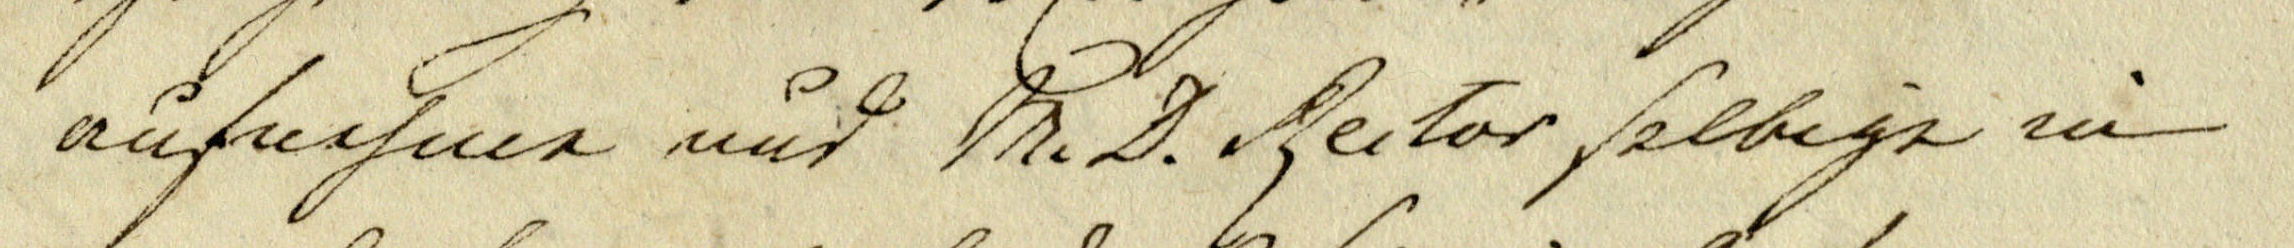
aufnehme und M. D. Rector selbige in
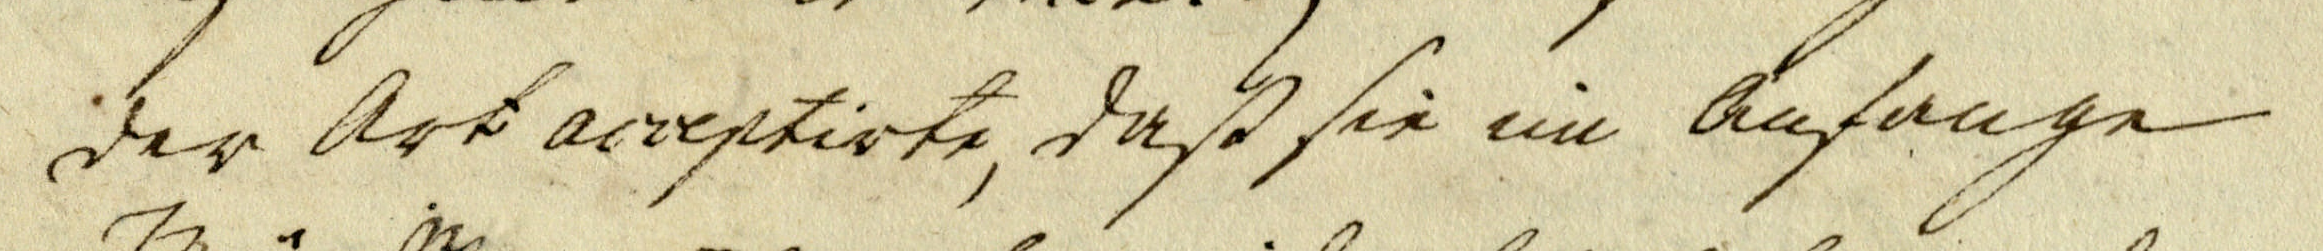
der Art acceptirte, daß sie im Anfange
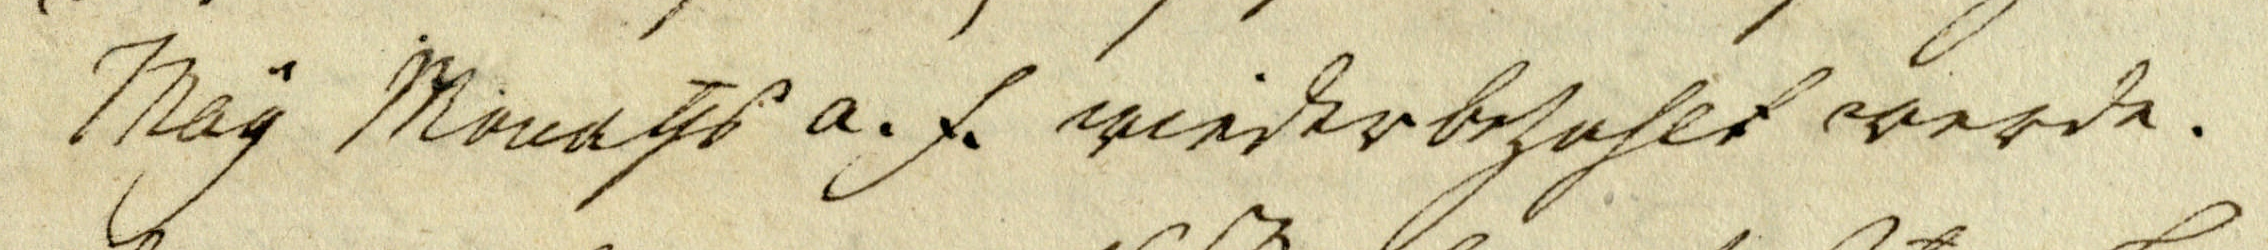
Maÿ Monaths a. f. wiederbezahlt werde.
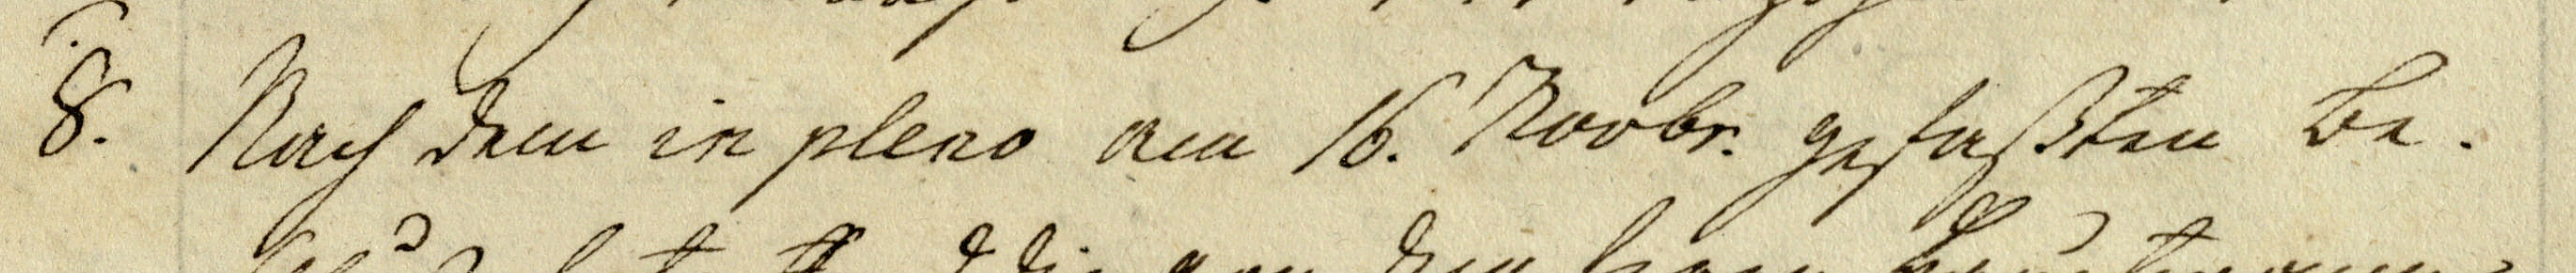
8. Nach dem in pleno am 16. Novbr. gefaßten Be¬
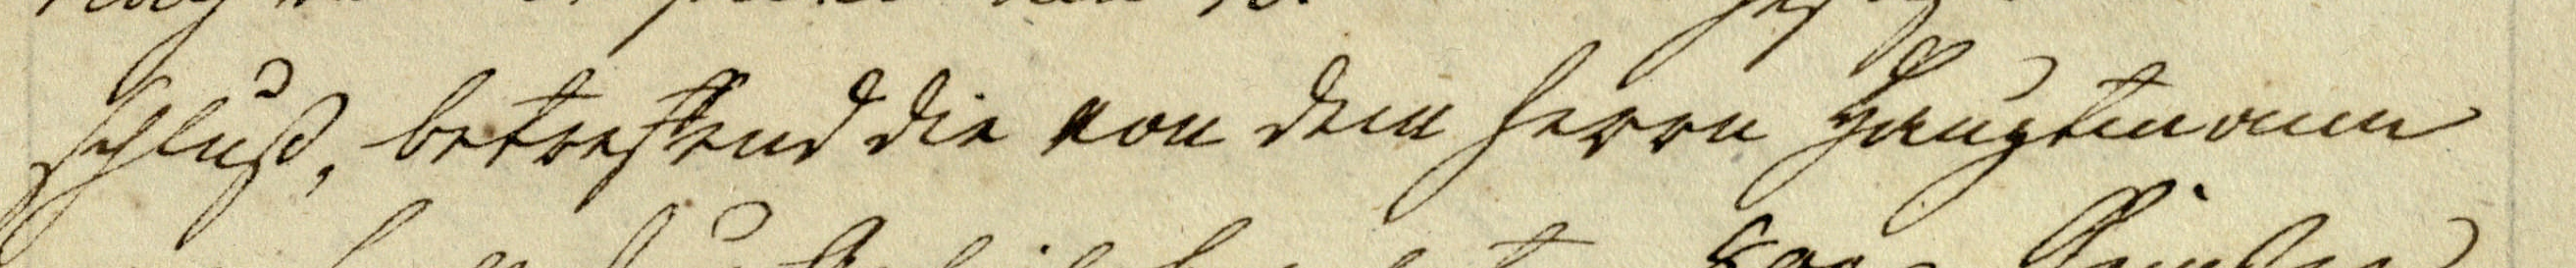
schluß, betreffend die von dem Herrn Hauptmann
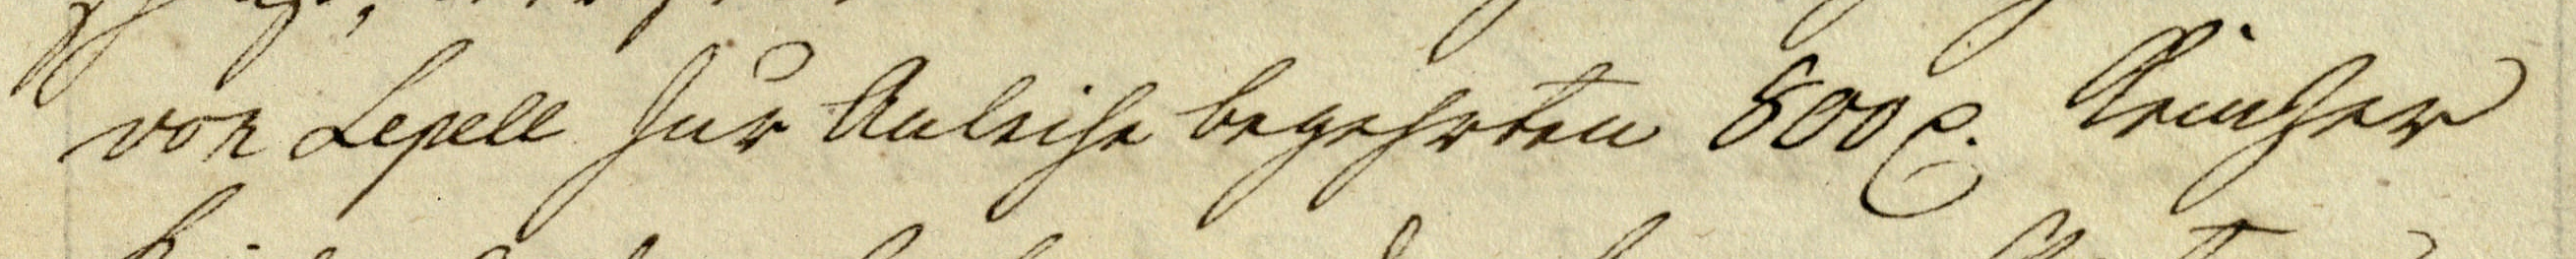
von Lepell zur Anleihe begehrten 800 l. Kemzer
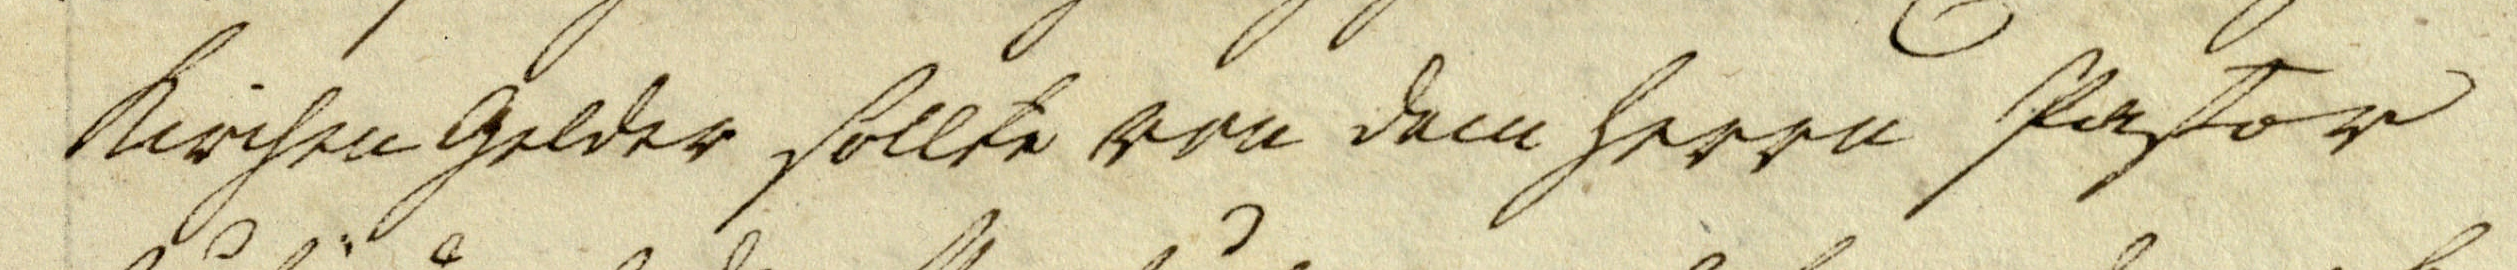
KirchenGelder sollte von dem Herrn Pastor
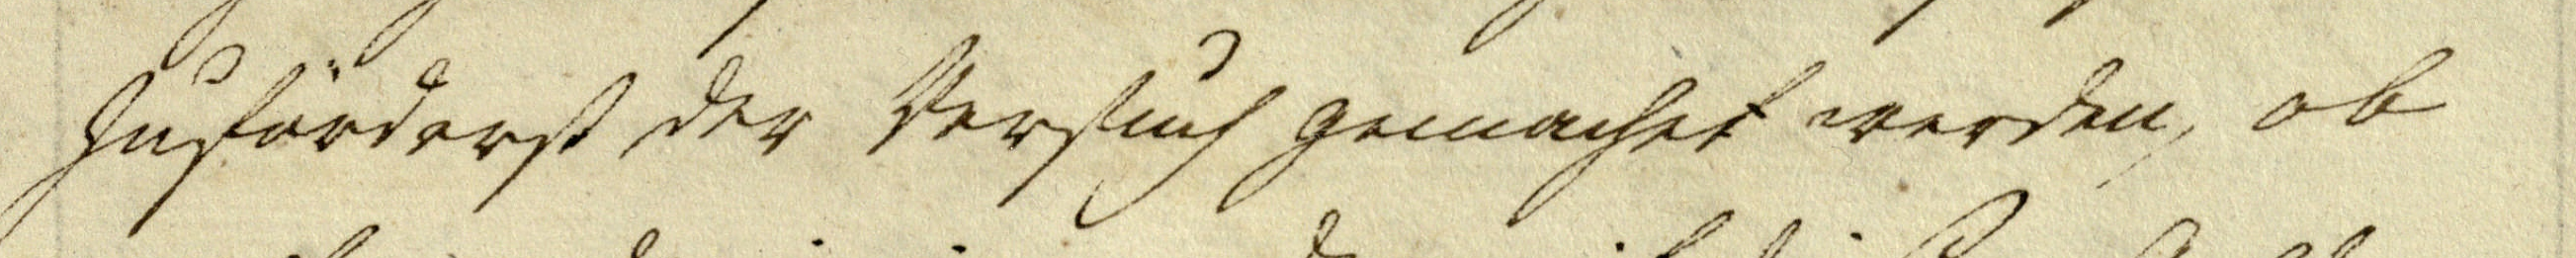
zuförderst der Versuch gemachet werden, ob
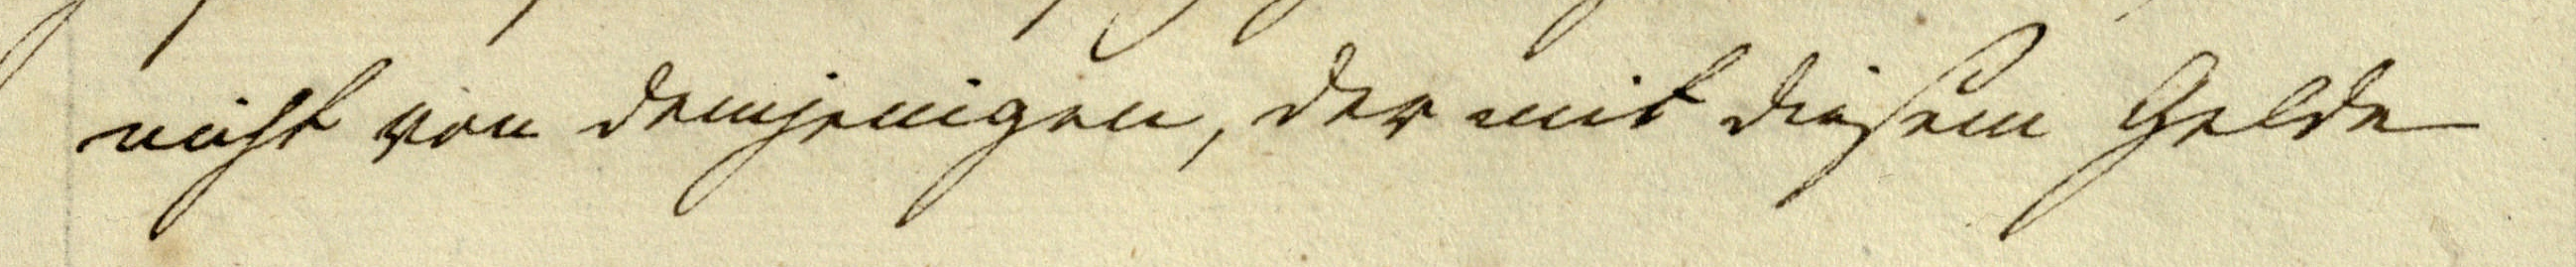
nicht von demjenigen, der mit diesem Gelde
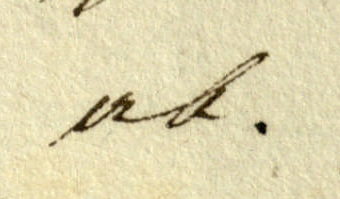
ab
